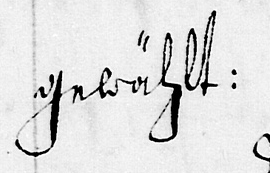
gewählt:
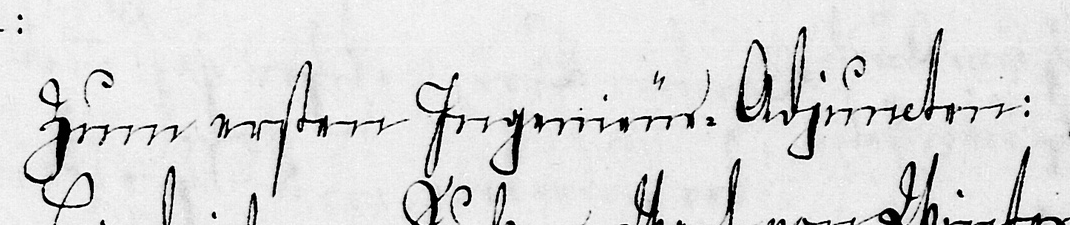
Zum ersten Ingenieur-Adjuncten:
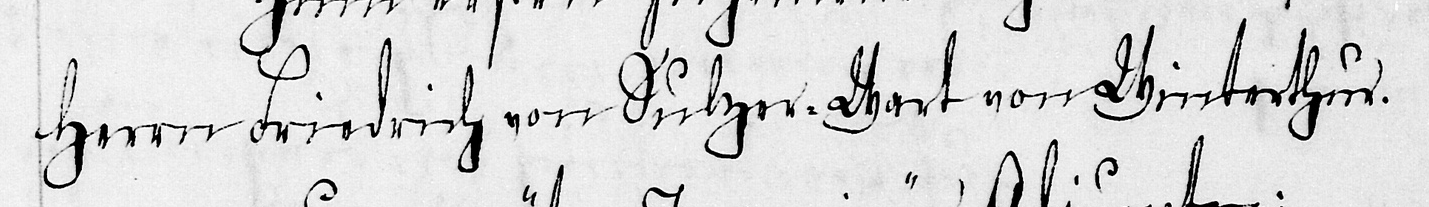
Herrn Friedrich von Sulzer-Wart von Winterthur.
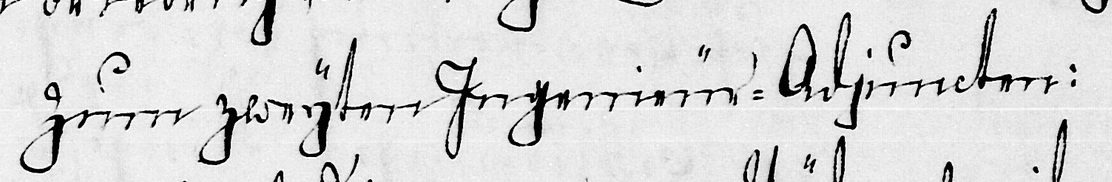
Zum zweyten Ingenieur-Adjuncten:
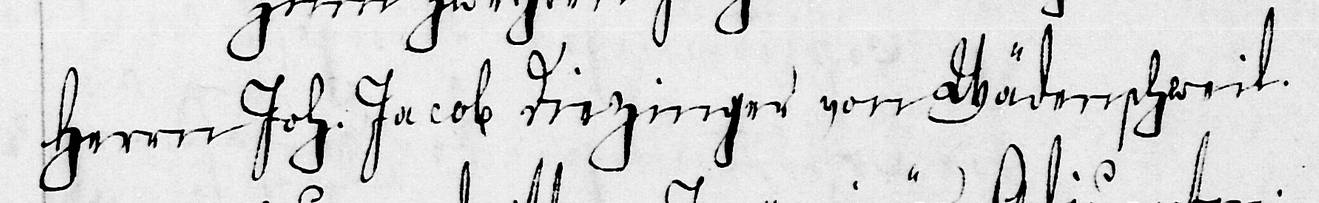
Herrn Joh. Jacob Diezinger von Wädenschweil.
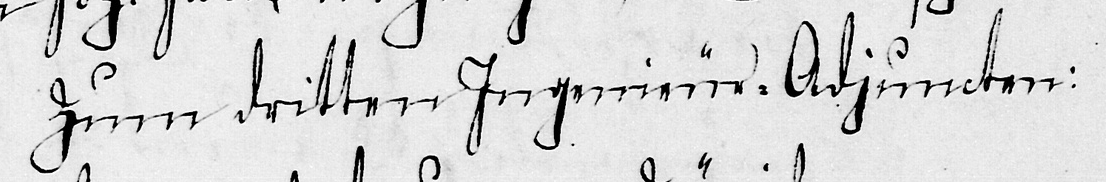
Zum dritten Ingenieur-Adjuncten:
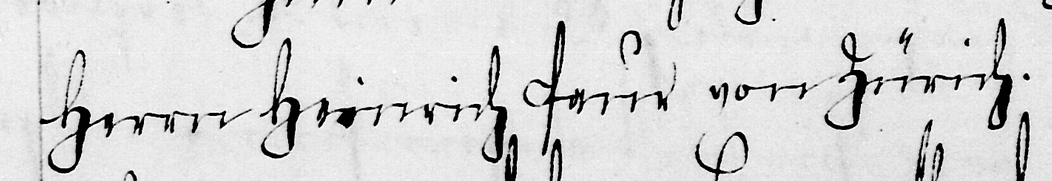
Herrn Heinrich Paur von Zürich.
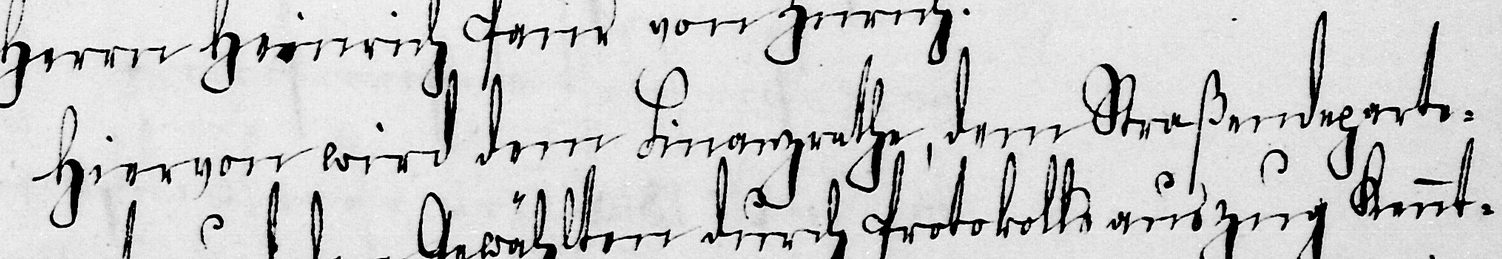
Hiervon wird dem Finanzrathe, dem Straßendeparte¬
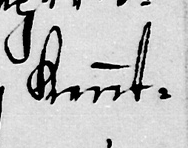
Kennt¬
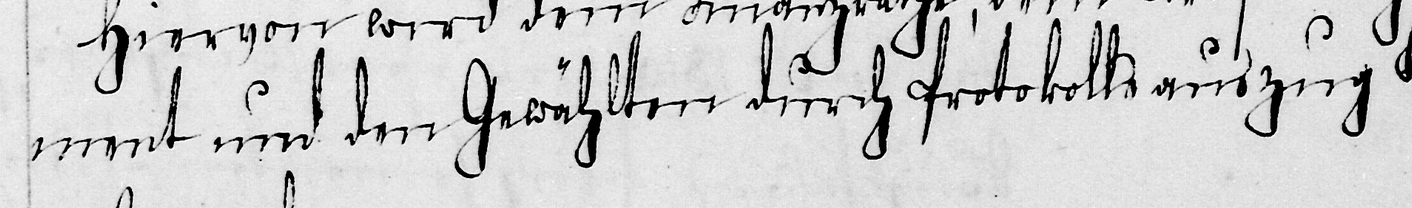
ment und den Gewählten durch Protokollsauszug
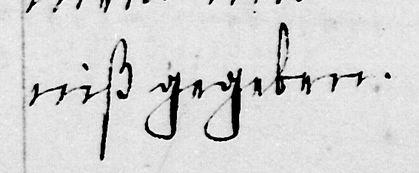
niß gegeben.
